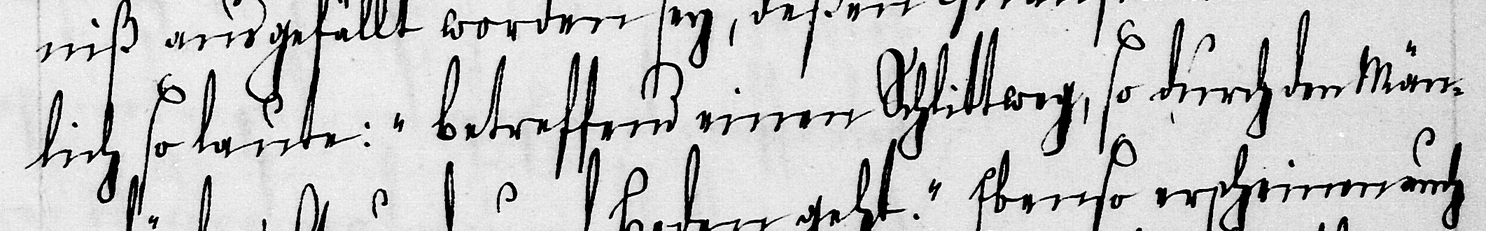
lich so laute: „betreffend einen Schlittweg, so durch den
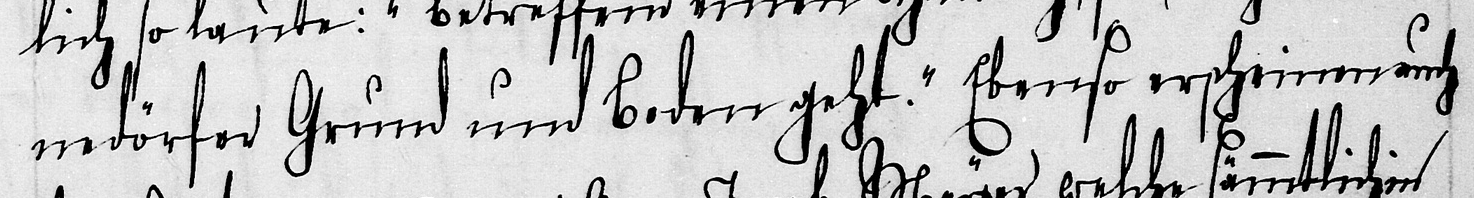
nedörfer Grund und Boden geht.“ Ebenso erscheinen auch
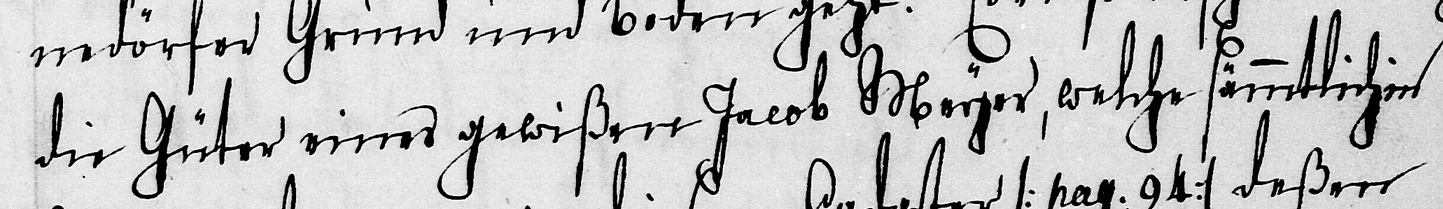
die Güter eines gewißen Jacob Meyer, welche sämmtlich
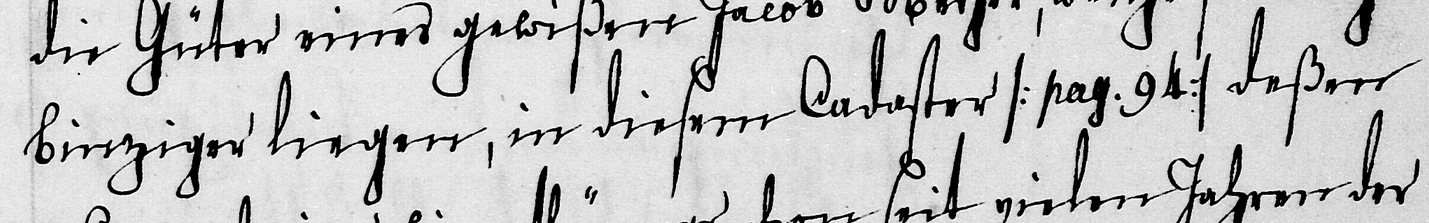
Binziger liegen, in diesem Cadaster [pag. 94] deßen
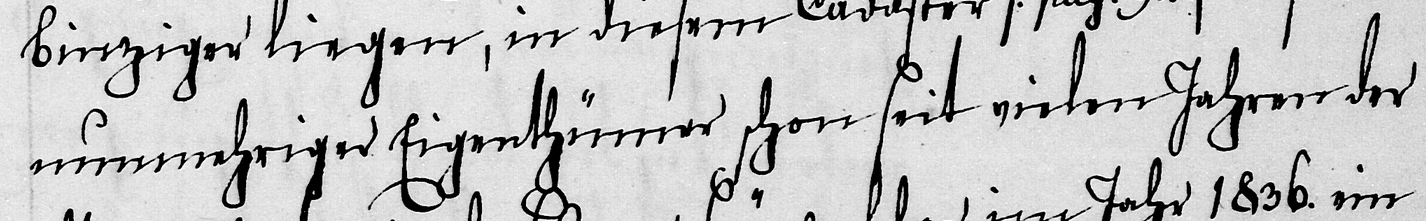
nunmehriger Eigenthümer schon seit vielen Jahren der
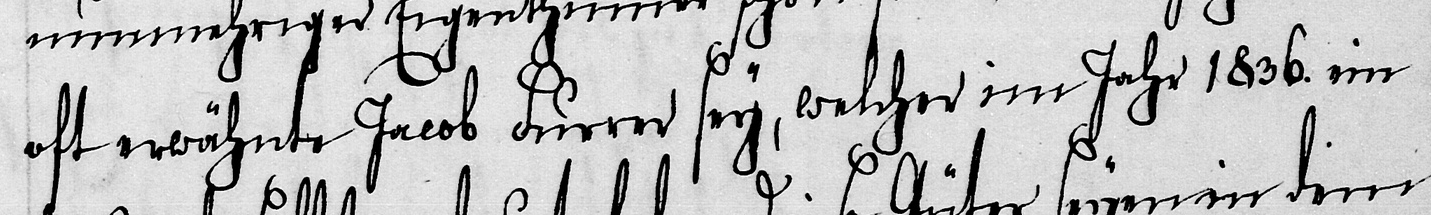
oft erwähnte Jacob Furrer sey, welcher im Jahr 1836. ein
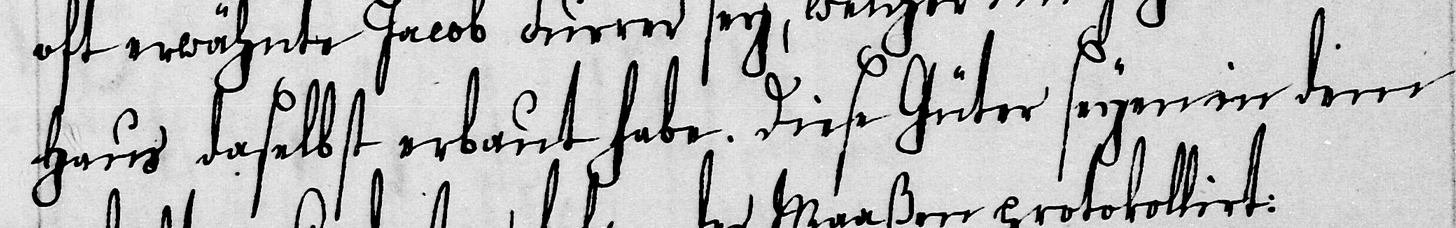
Haus daselbst erbaut habe. Diese Güter seyen in dem
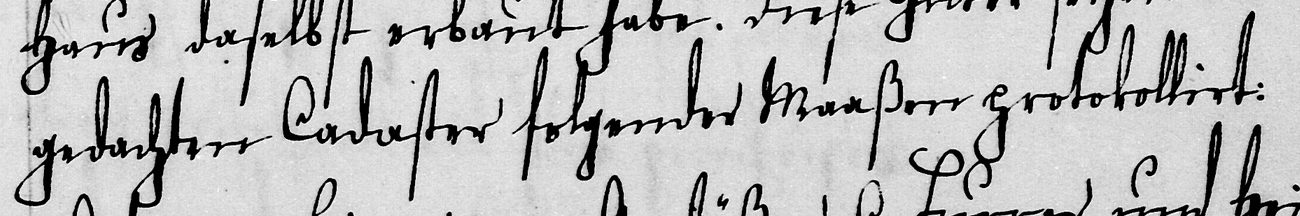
gedachten Cadaster folgender Maaßen protokollirt:
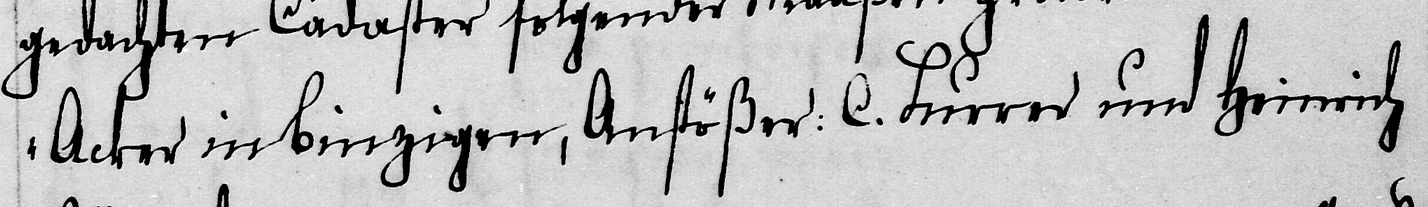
„Acker in Binzigen, Anstößer: C. Furrer und Heinrich
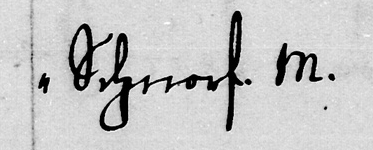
Schnorf. M.
